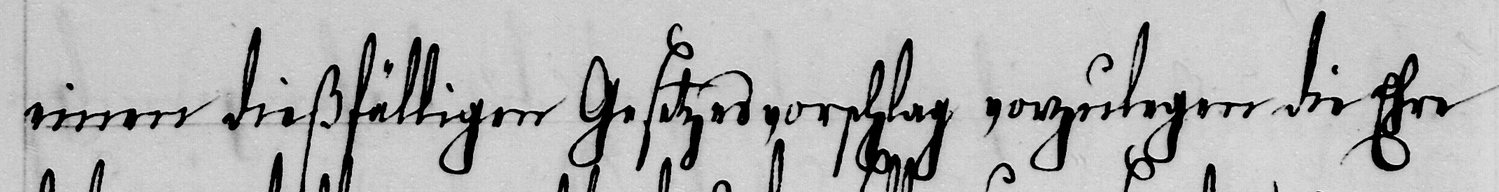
einen dießfälligen Gesetzesvorschlag vorzulegen die Ehre
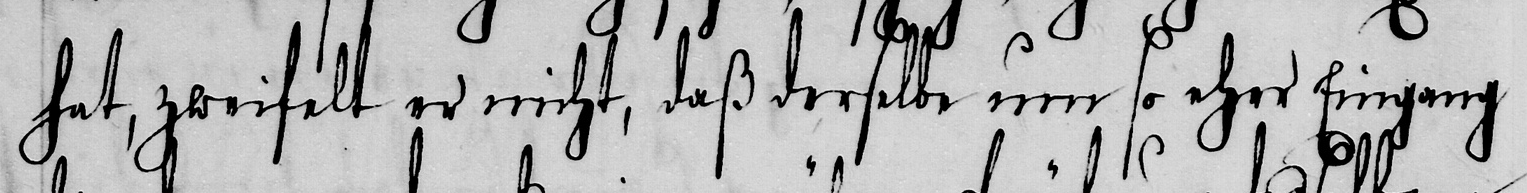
hat, zweifelt er nicht, daß derselbe um so eher Eingang
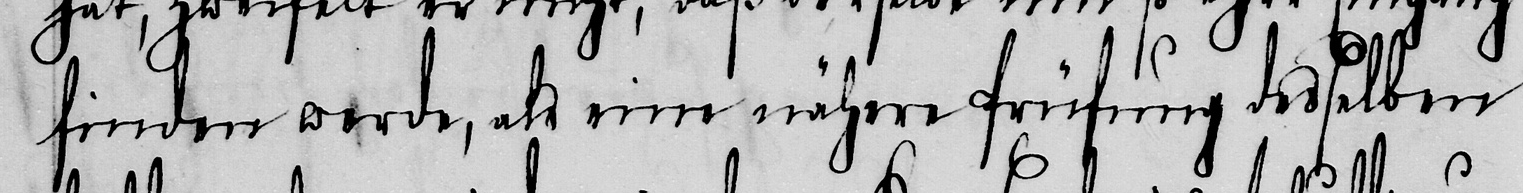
finden werde, als eine nähere Prüfung desselben
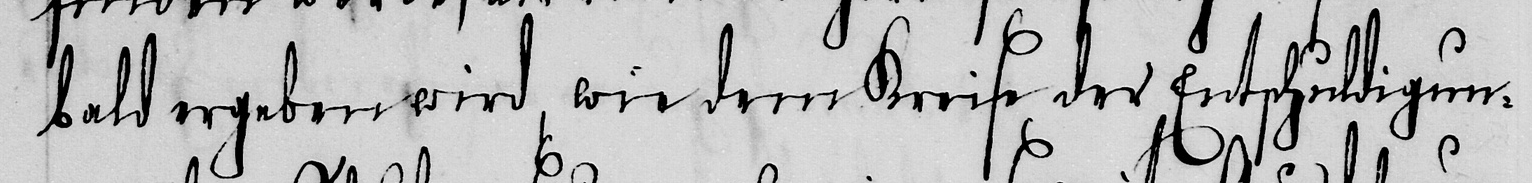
bald ergeben wird, wie dem Kreise der Entschuldigun¬
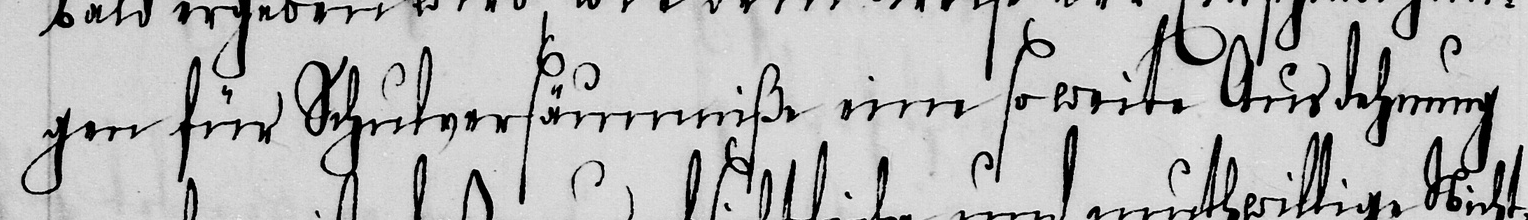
gen für Schulversäumniße eine so weite Ausdehnung
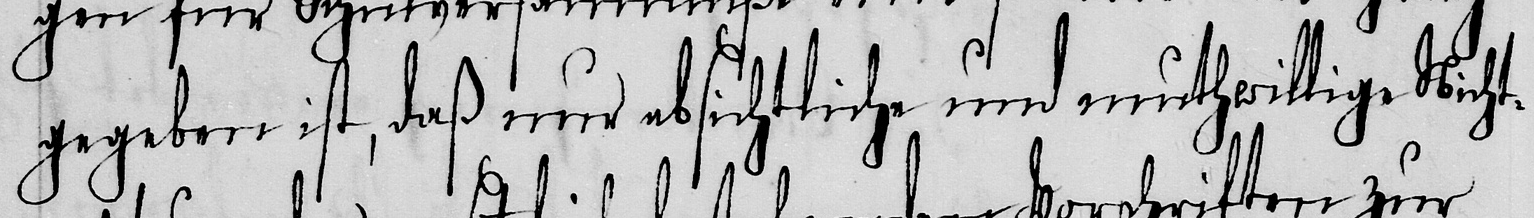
gegeben ist, daß nur absichtliche und muthwillige Nich¬
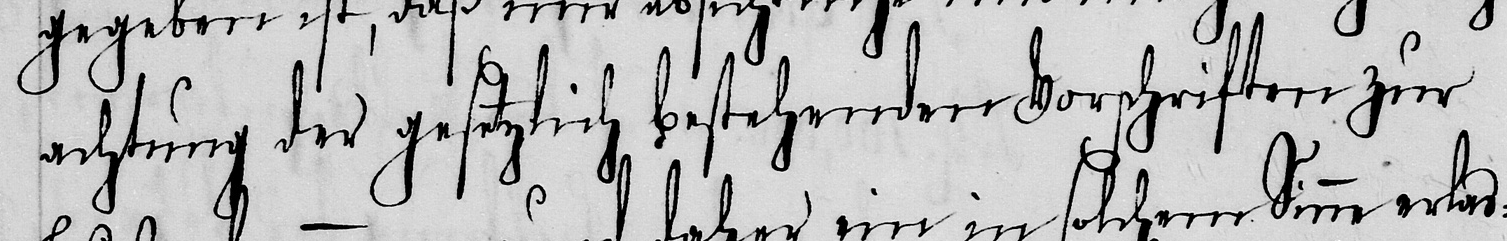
tachtung der gesetzlich bestehenden Vorschriften zur
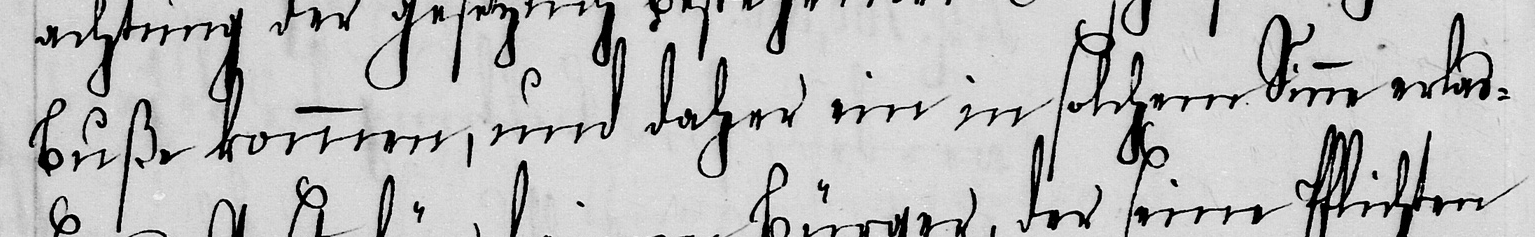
Buße kommen, und daher ein in solchem Sinne erlaß¬
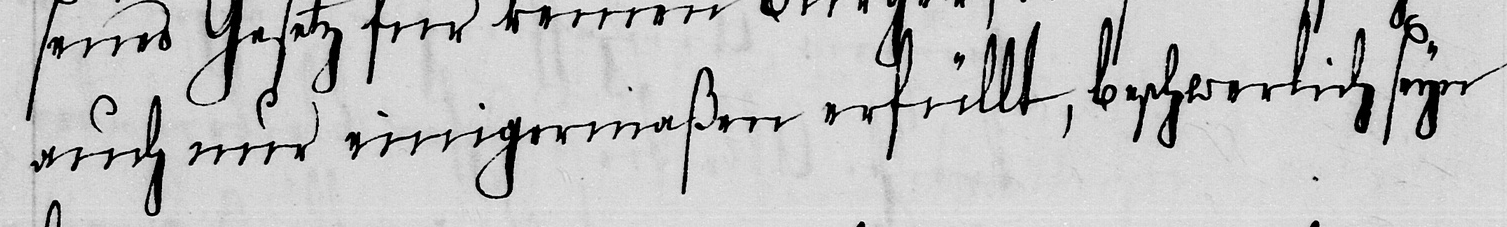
auch nur einigermaßen erfüllt, beschwerlich seyn
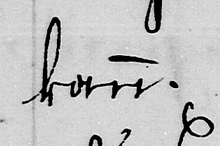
kann.
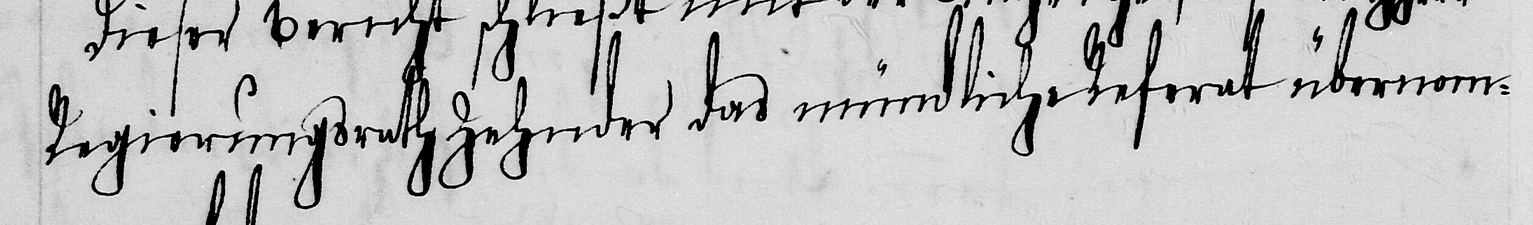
Regierungsrath Zehnder das mündliche Referat übernom¬
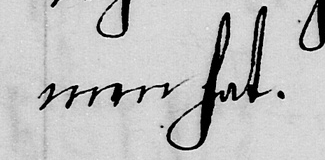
men hat.
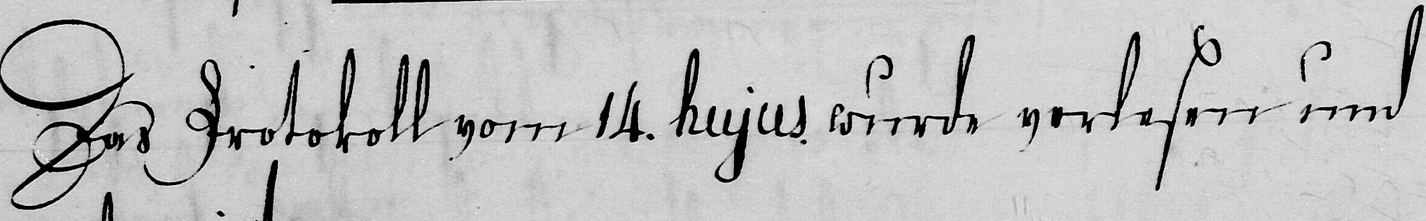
Das Protokoll vom 14. hujus wurde verlesen und
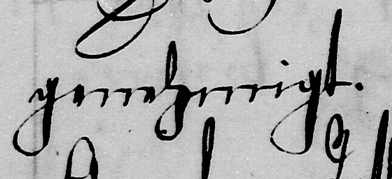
genehmigt.
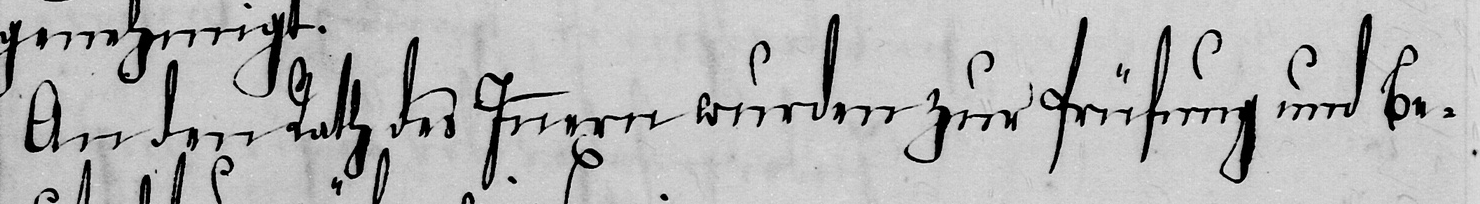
An den Rath des Innern wurden zur Prüfung und Be¬
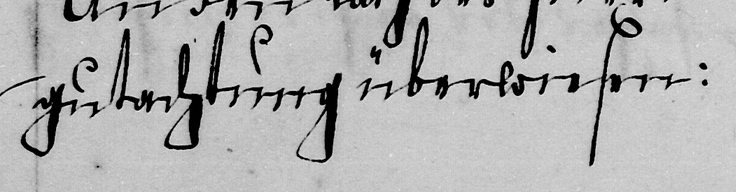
gutachtung überwiesen:
